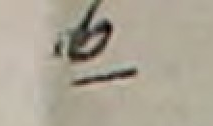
6
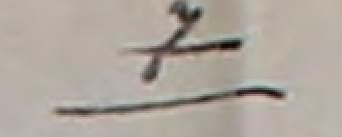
7
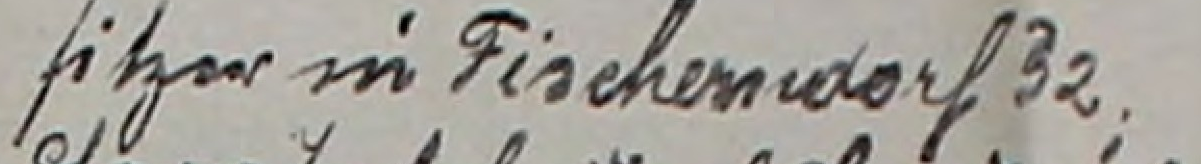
sitzer in Fischerndorf 32;
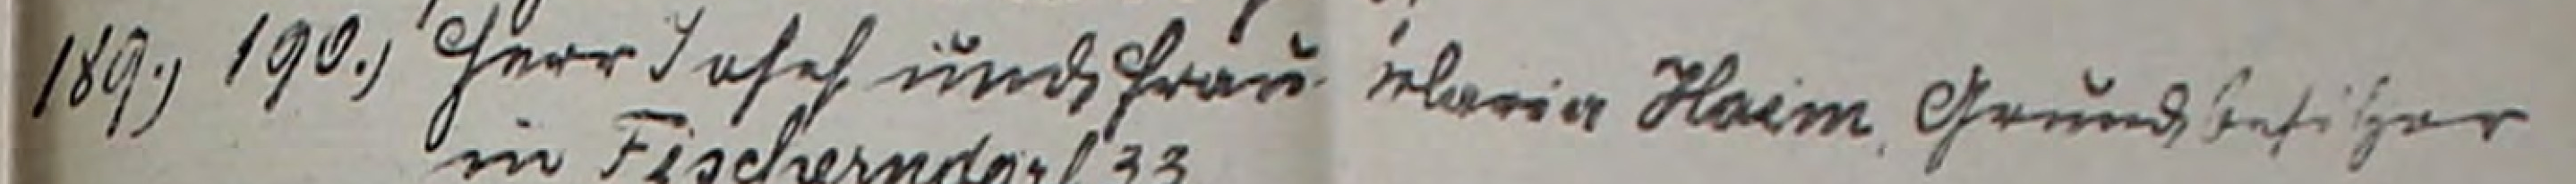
189.) 190.) Herr Josef und Frau Maria Haim, Grundbesitzer
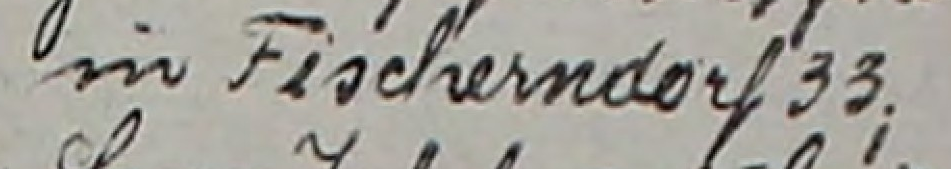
in Fischerndorf 33;
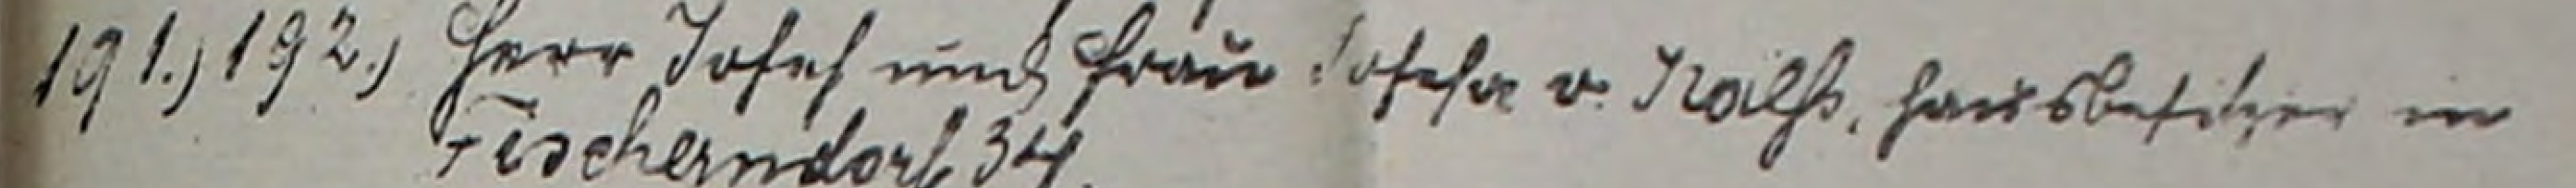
191.) 192.) Herr Josef und Frau Josefa v. Kalhs, Hausbesitzer in
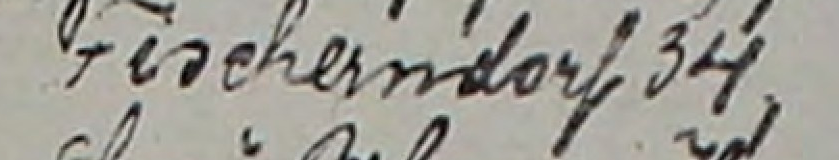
Fischerndorf 34;
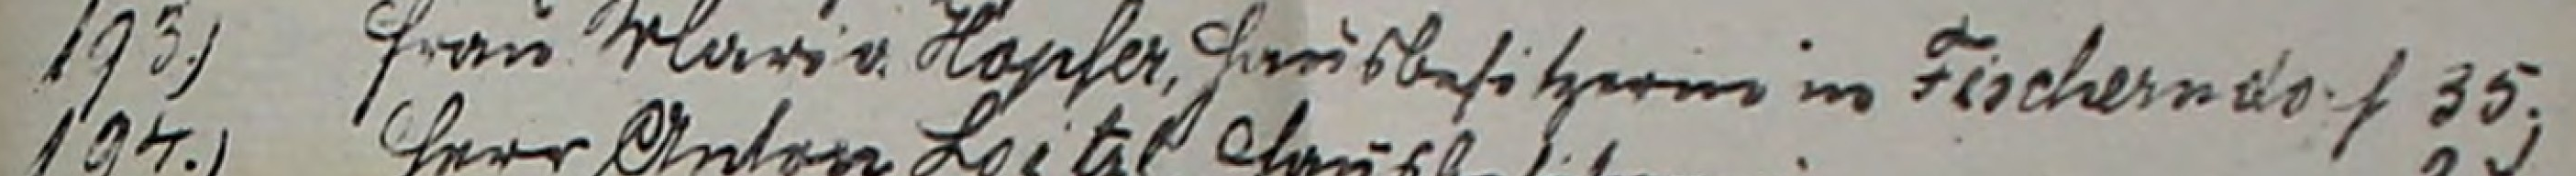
193.) Frau Maria Hopfer, Hausbesitzerin in Fischerndorf 35;
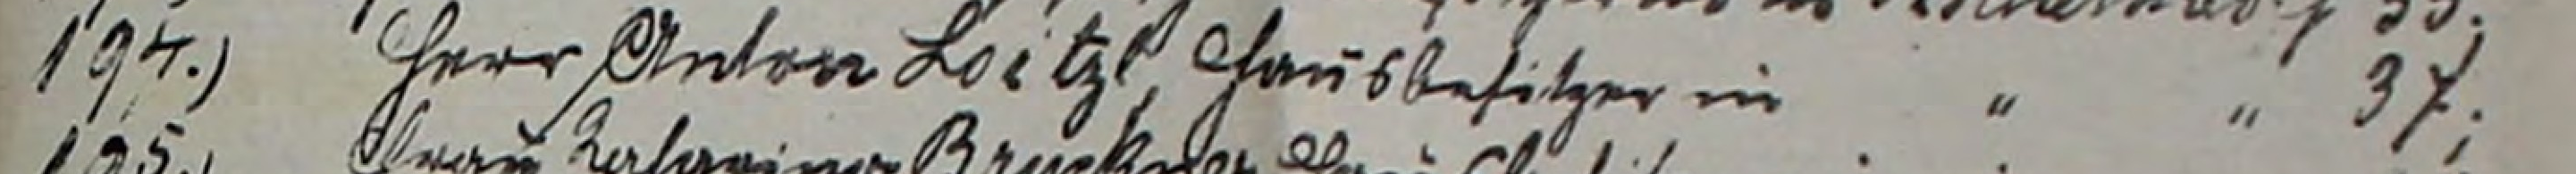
194.) Herr Anton Loitzl, Hausbesitzer in „ „ 37;
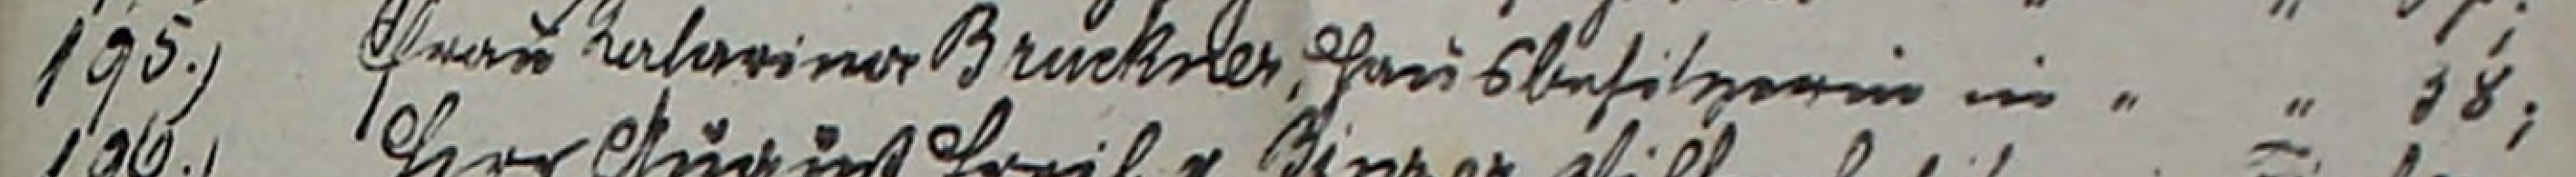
195.) Frau Katarina Bruckner, Hausbesitzerin in „ „ 38;
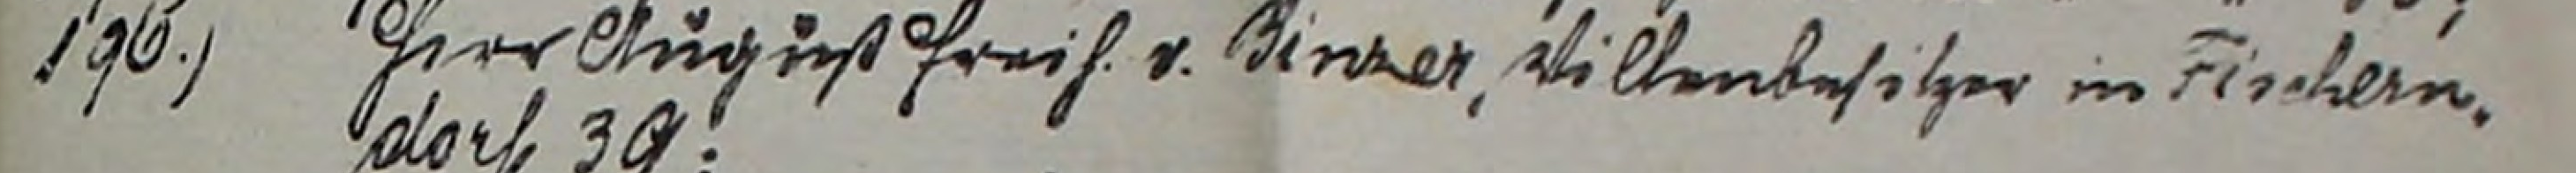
196.) Herr August Freih. v. Binzer, Villenbesitzer in Fischern„
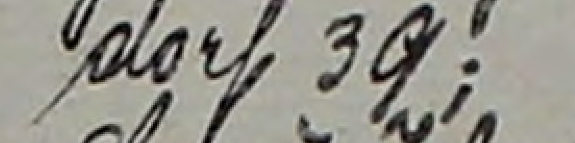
dorf 39;
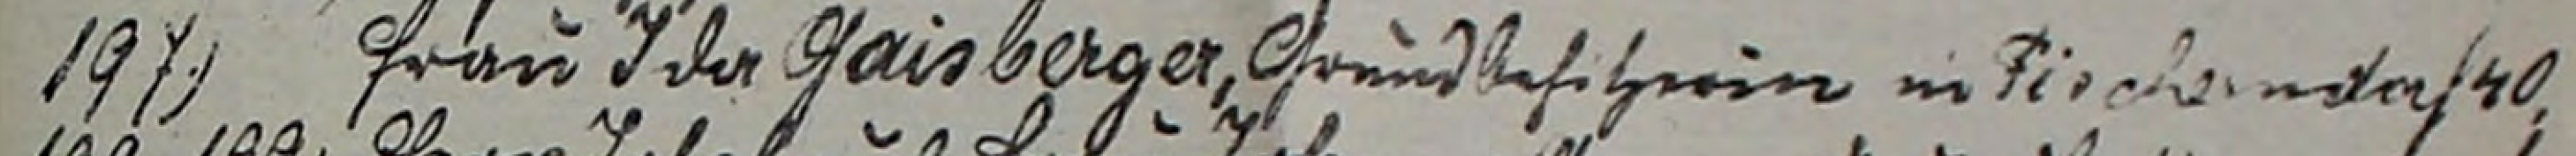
197.) Frau Ida Gaisberger, Grundbesitzerin in Fischerndorf 40;
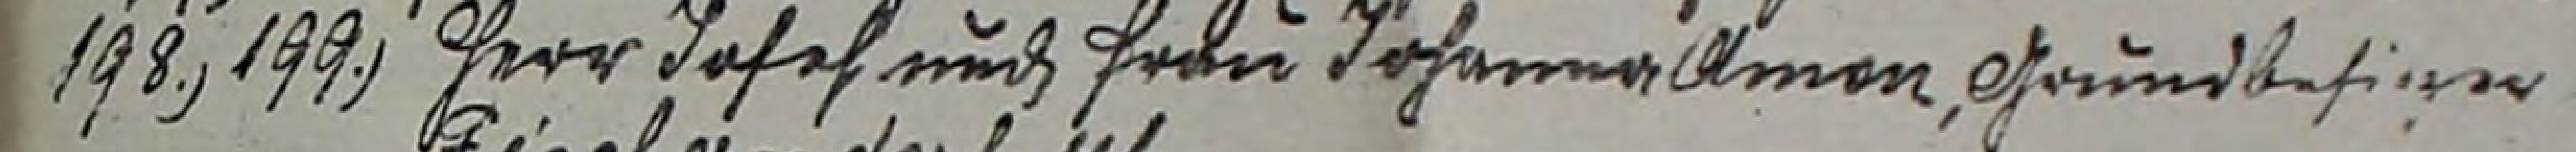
198.) 199.) Herr Josef und Frau Johanna Amon, Grundbesitzer in
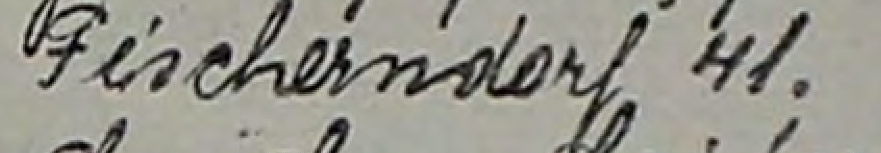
Fischerndorf 41;
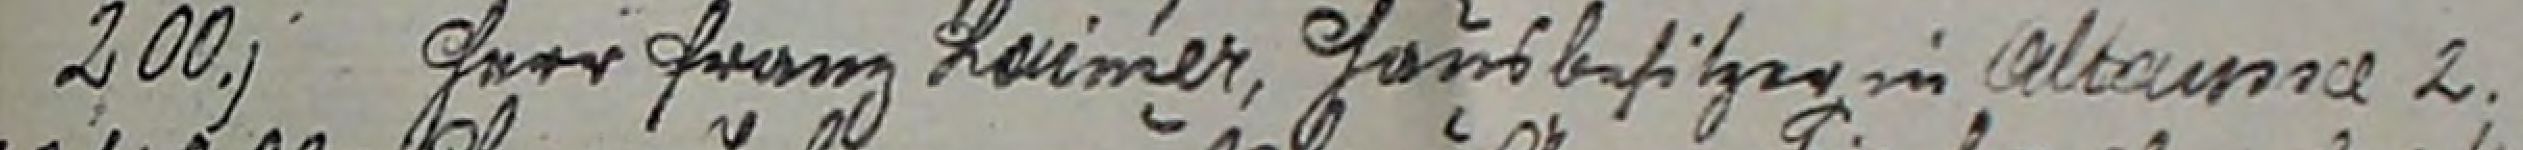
200.) Herr Franz Laimer, Hausbesitzer in Altaussee 2;
